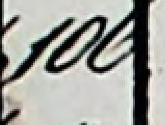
106
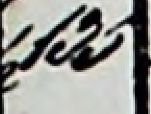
135
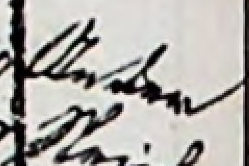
An der
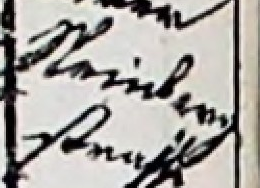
Steinberg„
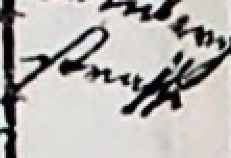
strasse
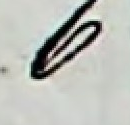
6
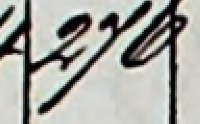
276
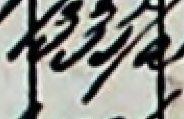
1335/a
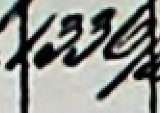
1336/a
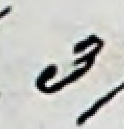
3
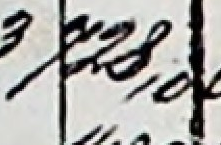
728,0
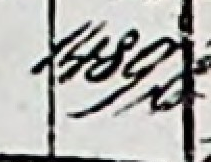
1489,6
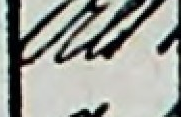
Alt
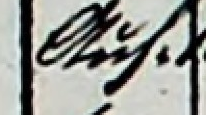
Aus„
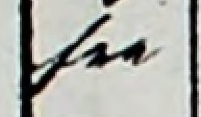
see
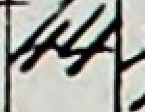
44
